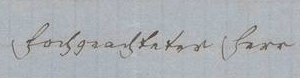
Hochgeachteter Herr
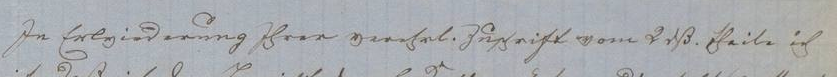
In Erwiederung Ihrer verehrl. Zuschrift vom 2 dß. theile ich
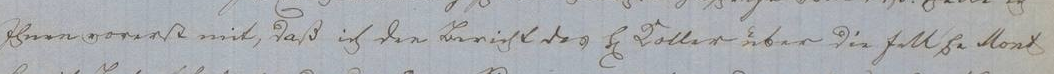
Ihnen vererst mit, daß ich den Bericht des Hrn Koller über die Fell'sche Mont-
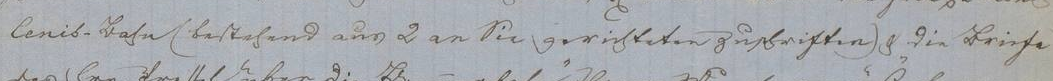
Cenis-Bahn (bestehend aus 2 an Sie gerichteten Zuschriften) & die Briefe
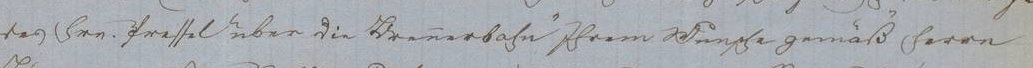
des Hrn. Pressel über die Brennerbahn «Ihrem Wunsche gemäß» Herrn
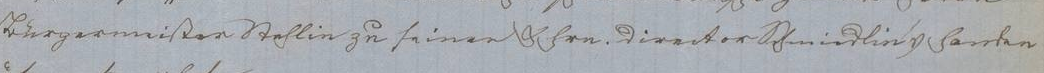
Bürgermeister Stehlin zu seiner & Hrn. Director Schmidlin's Handen
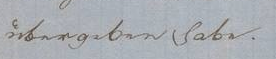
übergeben habe.
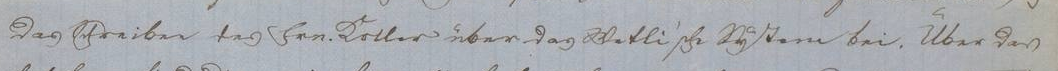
das Schreiben des Hrn. Koller über das Wetli'sche System bei. Über das
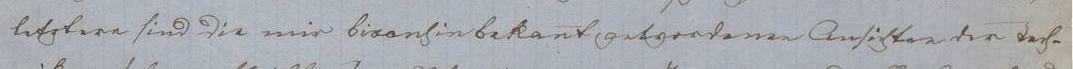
letztere sind die mir bisanhin bekannt gewordene Ansichten der Tech-
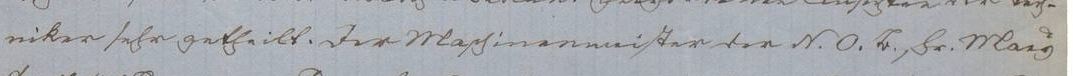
niker sehr getheilt. Der Maschinenmeister der N.O.B., Hr. Maey
